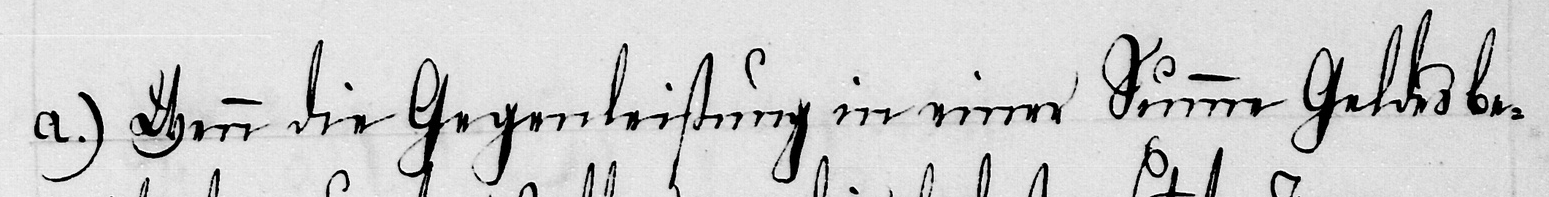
a.) Wenn die Gegenleistung in einer Summe Geldes be¬
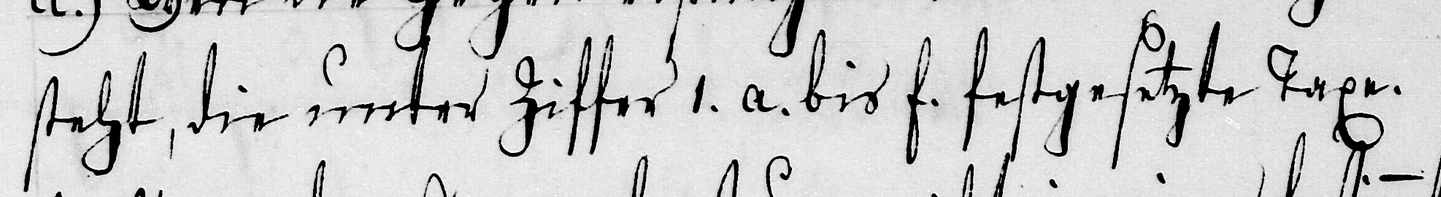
steht, die unter Ziffer 1. a. bis f. festgesetzte Taxe.
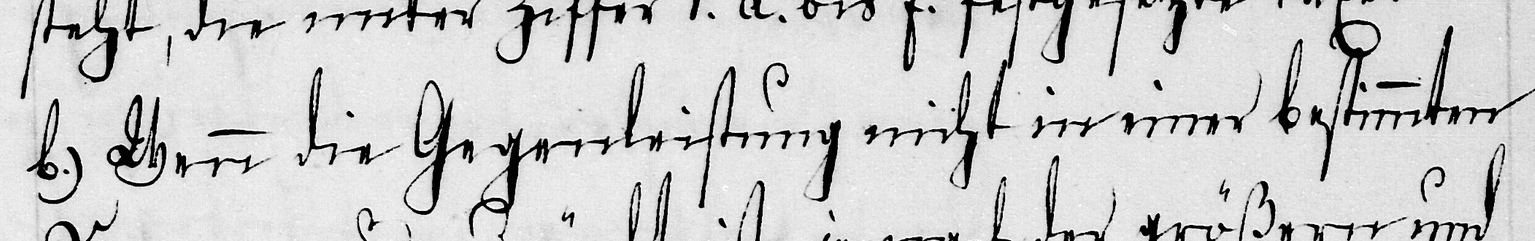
b.) Wenn die Gegenleistung nicht in einer bestimmten
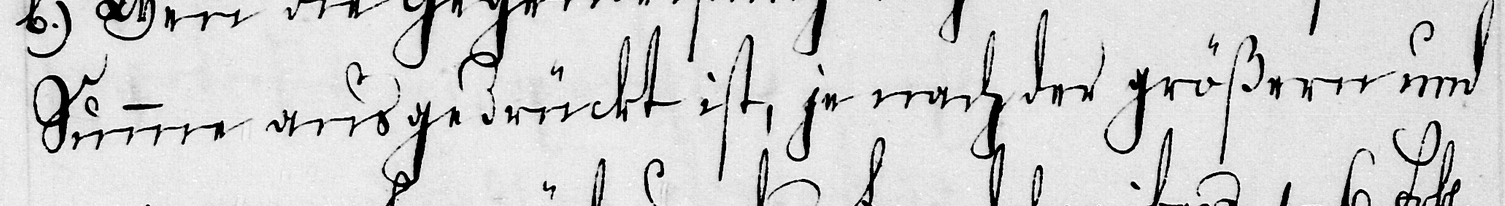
Summe ausgedrückt ist, je nach der größern und
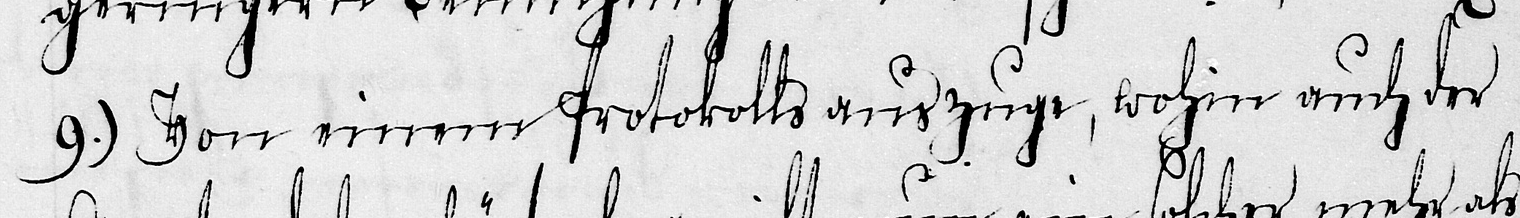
9.) Von einem Protokollsauszuge, wohin auch der
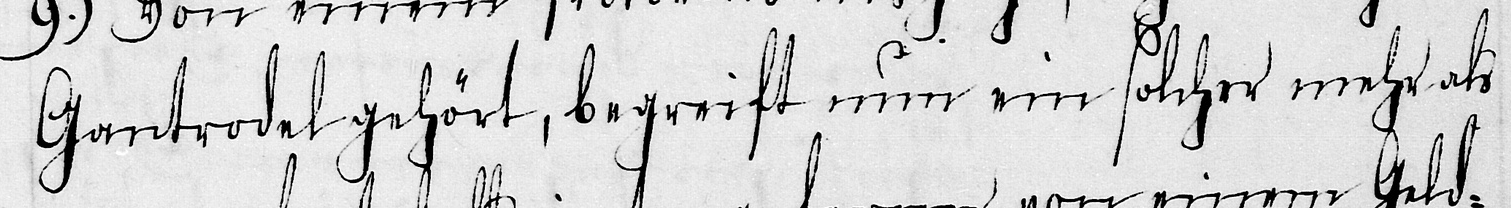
Gantrodel gehört, begreift nun ein solcher mehr als
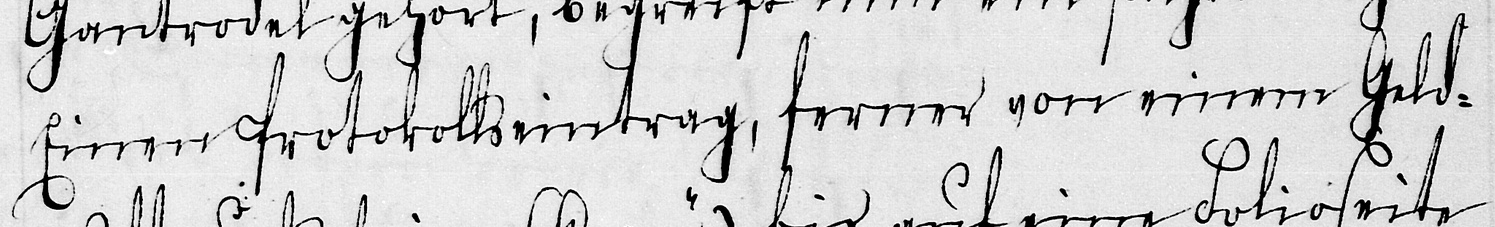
Einen Protokollseintrag, ferner von einem Geld¬
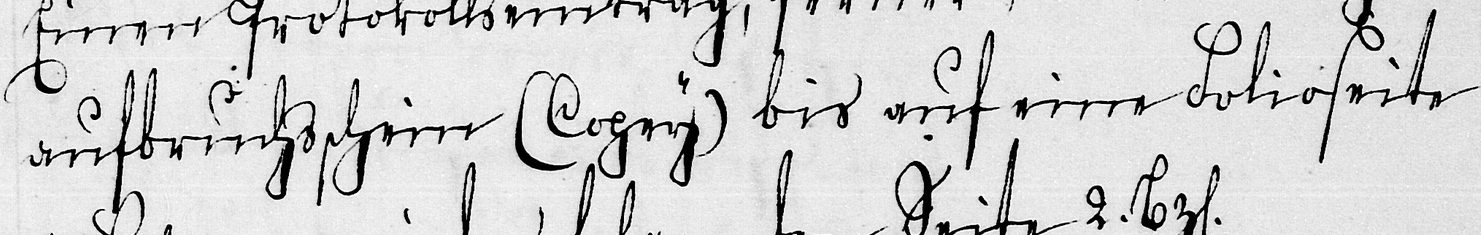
aufbruchsschein (Copey) bis auf eine Folioseite
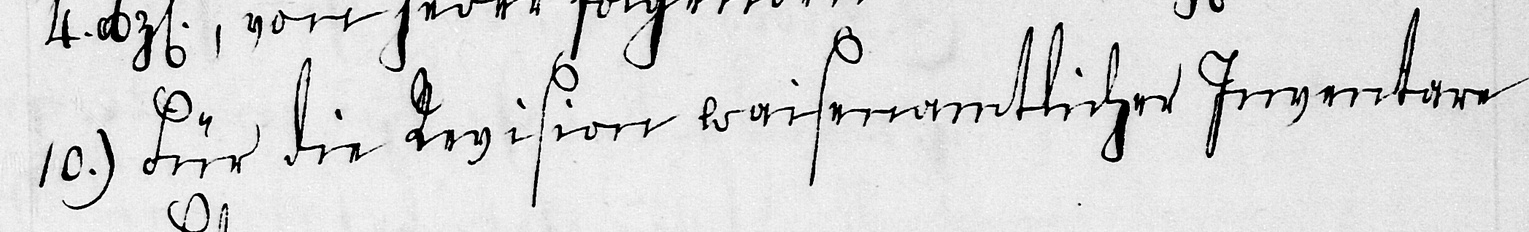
10.) Für die Revision waisenamtlicher Inventare
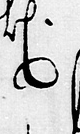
11.)
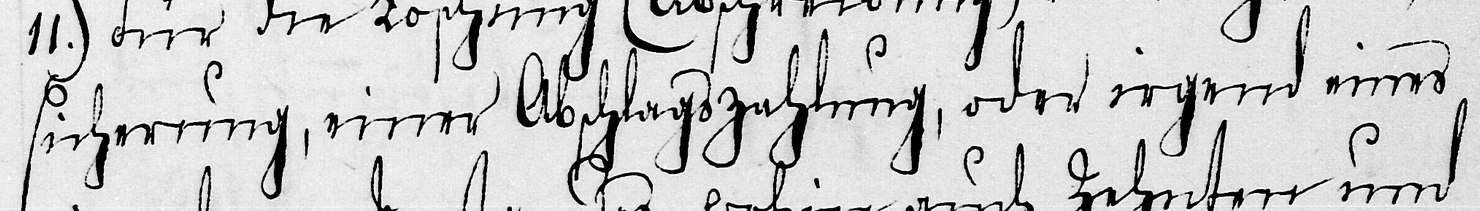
sicherung, einer Abschlagszahlung, oder irgend eines
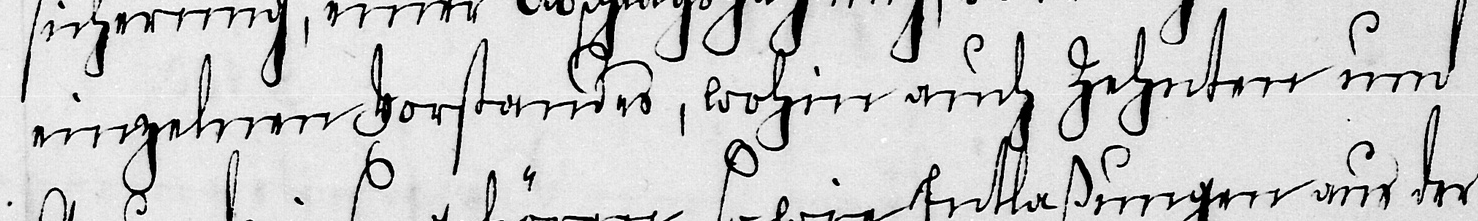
einzelnen Vorstandes, wohin auch Zehnten und
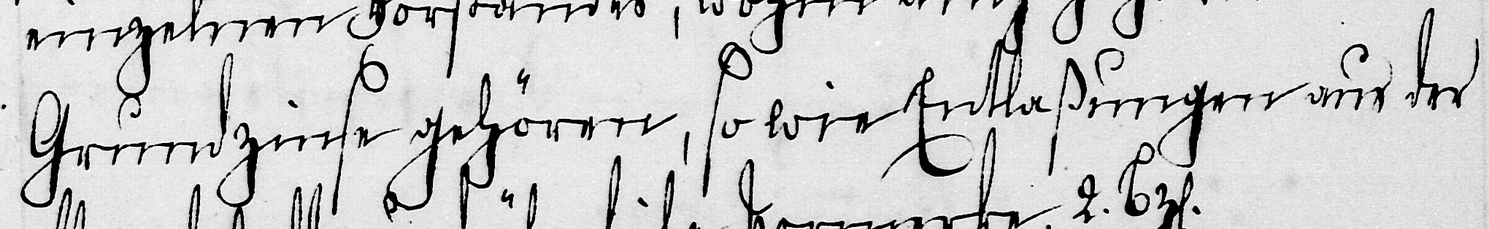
Grundzinse gehören, so wie Entlaßungen aus der
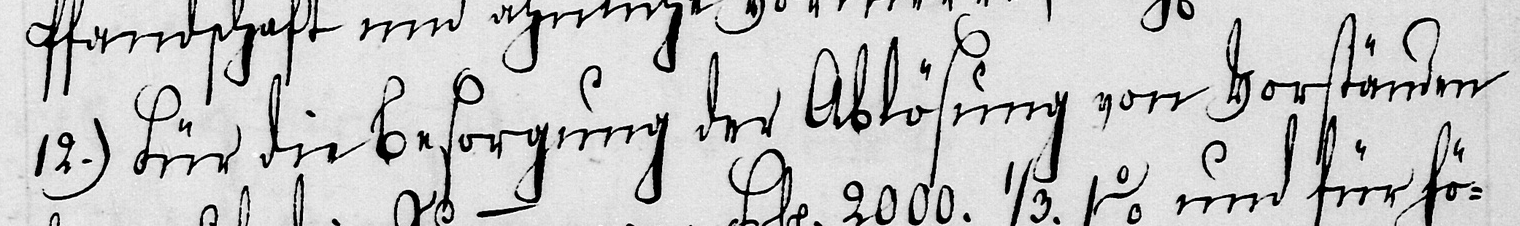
12.) Für die Besorgung der Ablösung von Vorständen
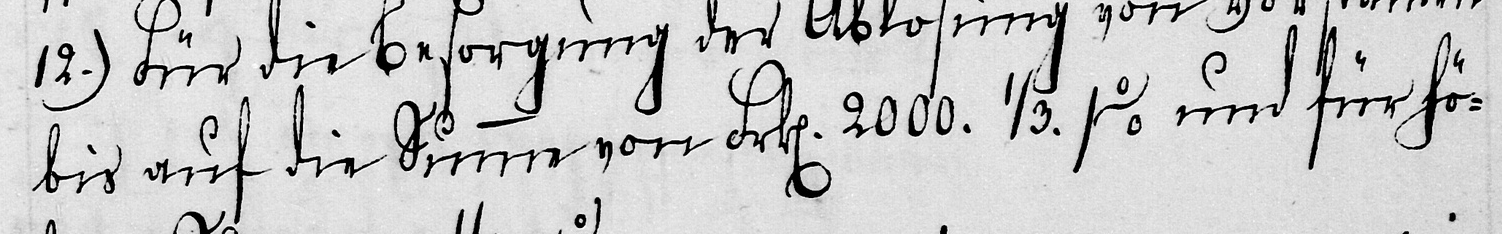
bis auf die Summe von Frk[en]. 2000. 1/3. % und für hö¬
